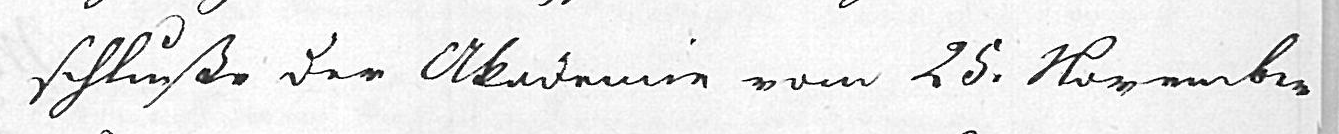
schluße der Akademie von 25. November
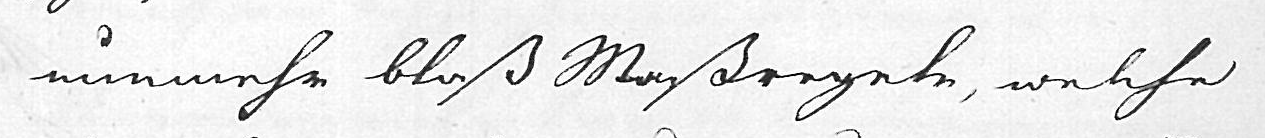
nunmehr bloß Maßregeln, welche
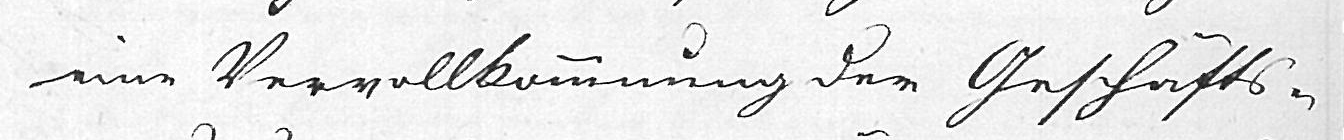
eine Vervollkommnung der Geschäfts-
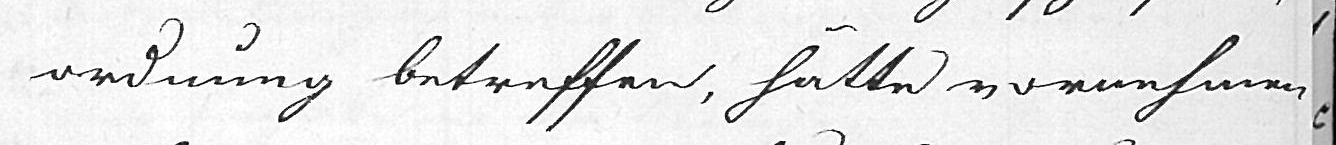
ordnung betreffen, hätte vornehmen
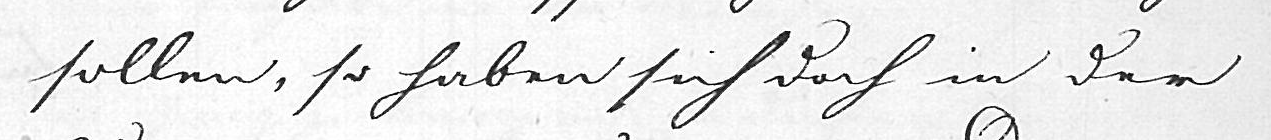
sollen, so haben sich doch in der
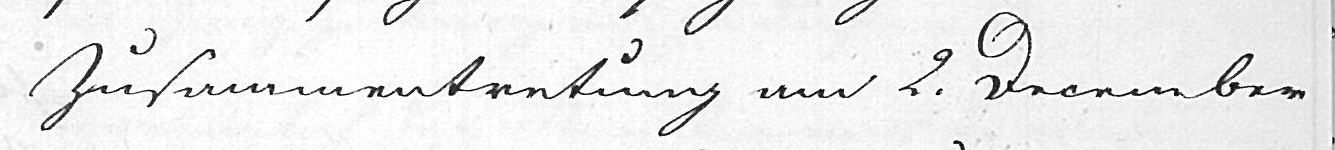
Zusammentretung am 2. December
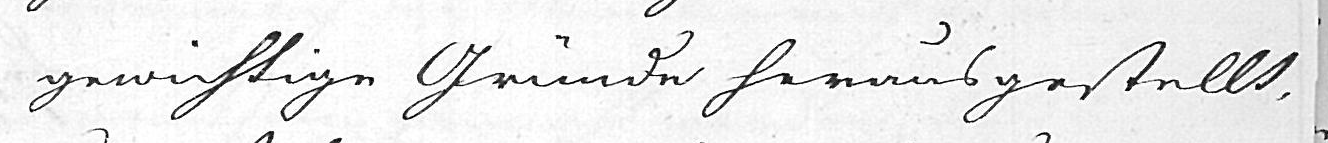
gewichtige Gründe herausgestellt,
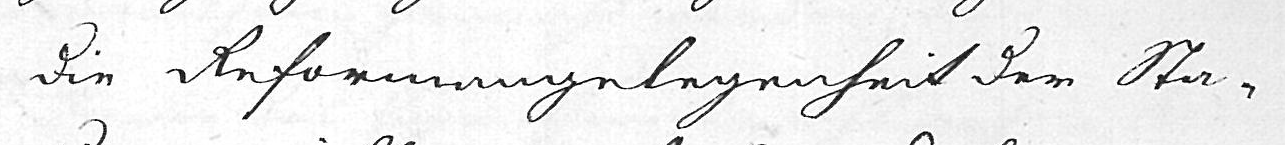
die Reformangelegenheit der Sta-
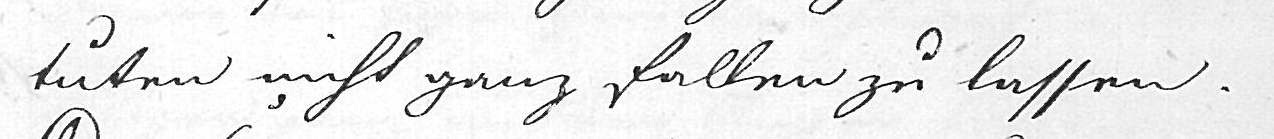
tuten nicht ganz fallen zu lassen.
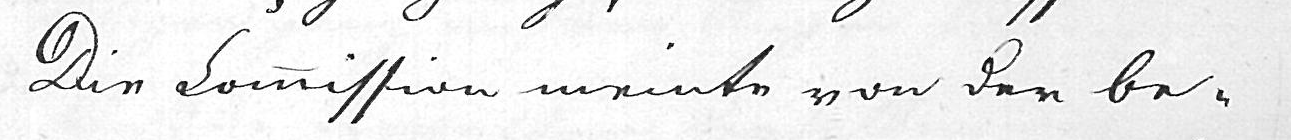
Die Commission meinte von der be-
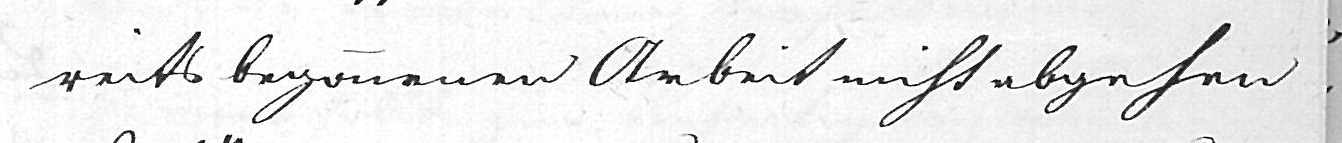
reits begonnenen Arbeit nicht abgehen
